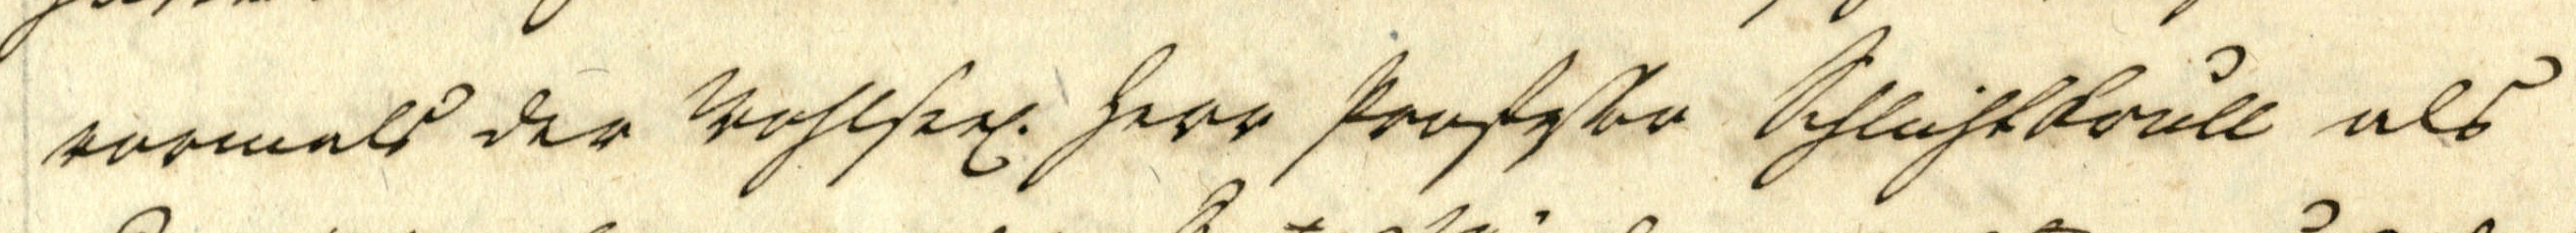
vormals der Wohlseel. Herr Professor Schlichtkrull als
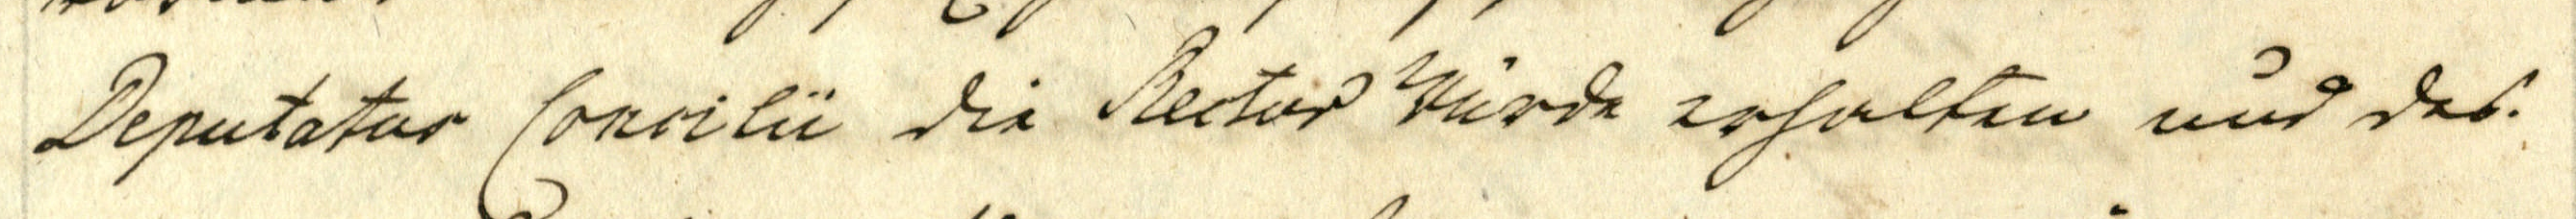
Deputatus Concilii die Rector Würde erhalten und des¬
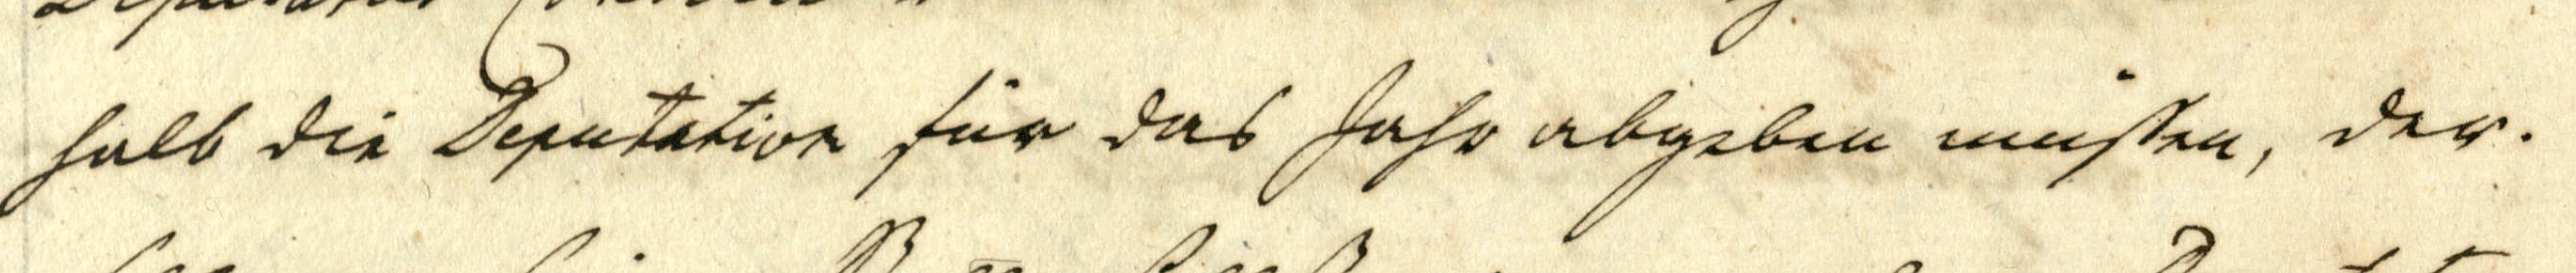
halb die Deputation für das Jahr abgeben müssen, der¬
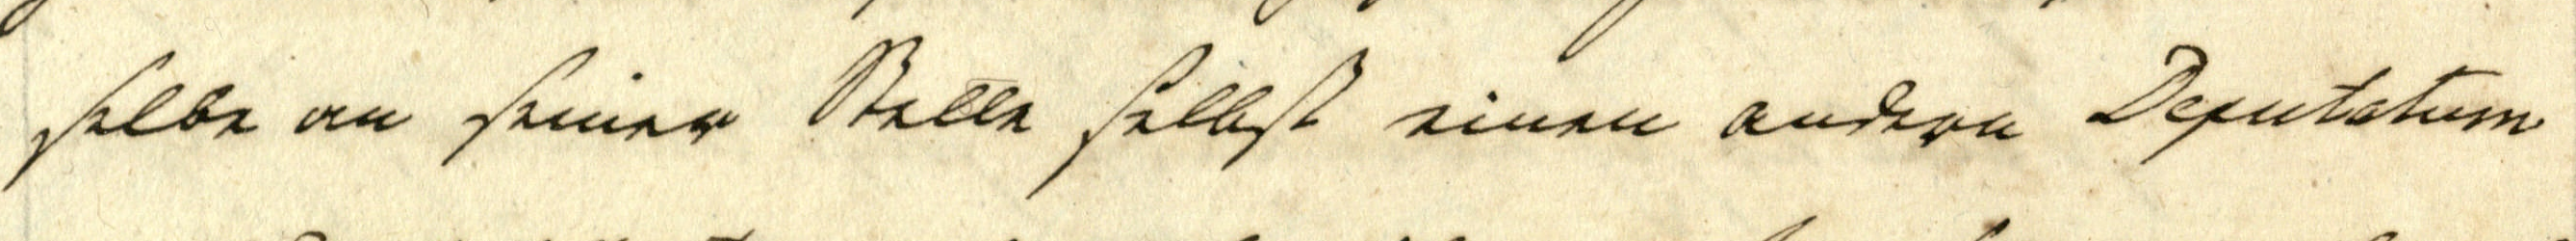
selbe an seiner Stelle selbst einen andern Deputatum
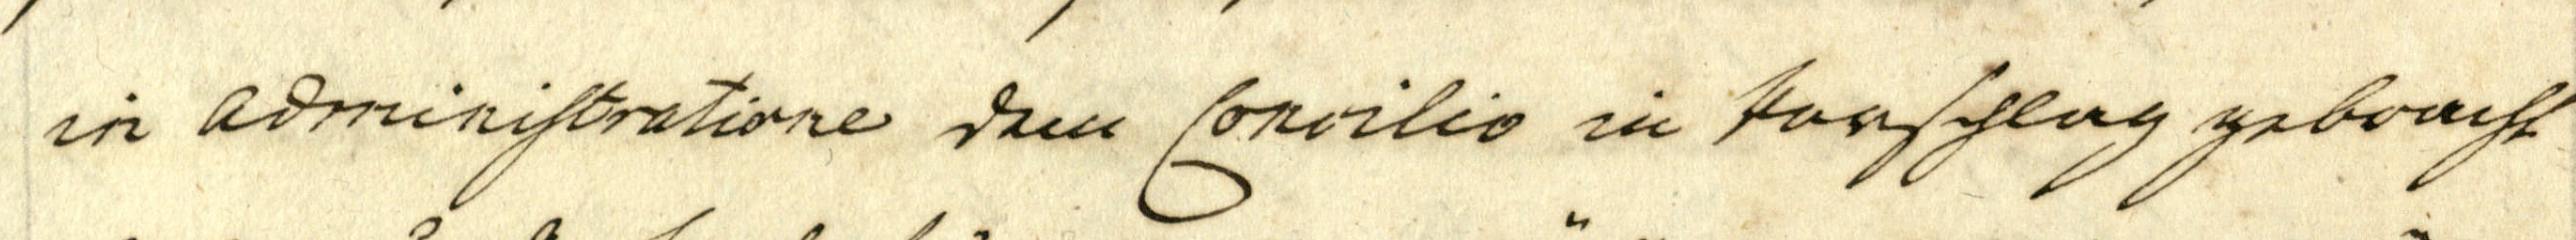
in Administratione dem Concilio in Vorschlag gebracht
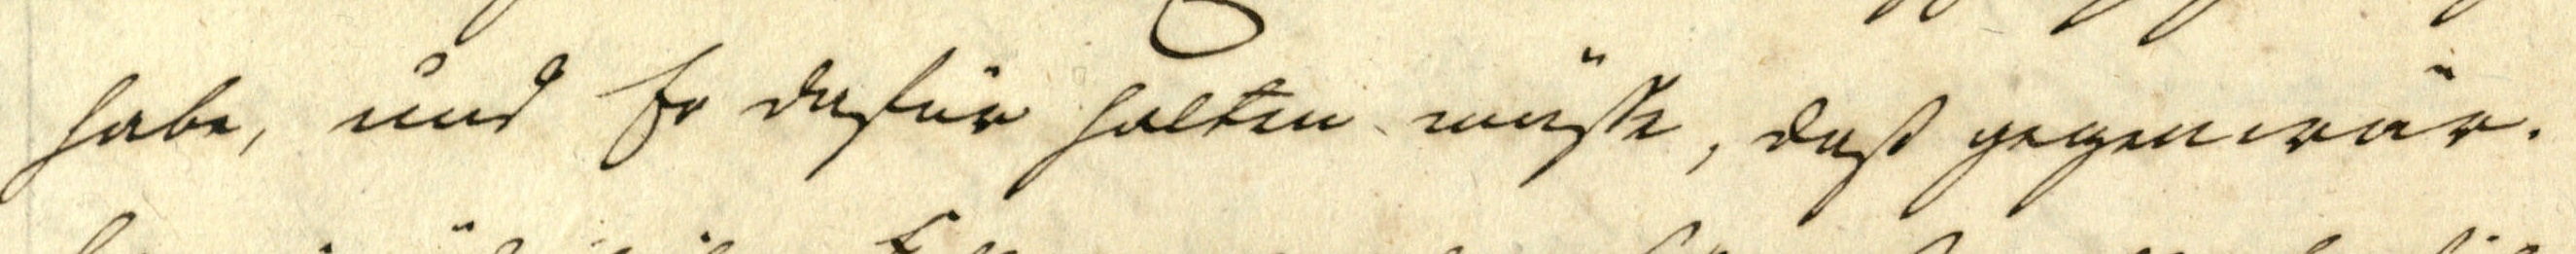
habe, und Er dafür halten müsse, daß gegenwär¬
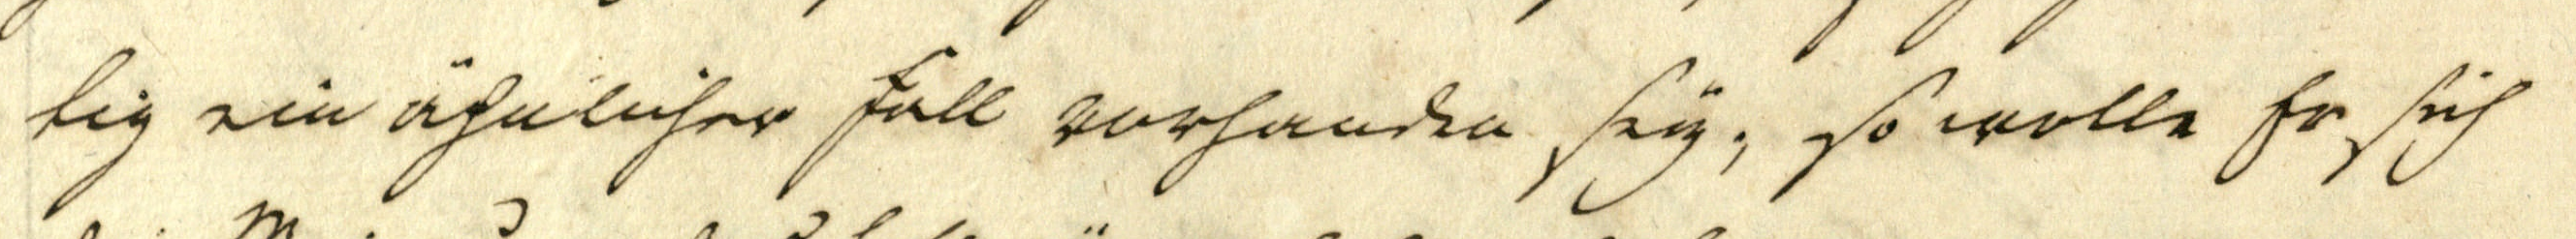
tig ein ähnlicher Fall vorhanden seÿ, so wolle Er sich
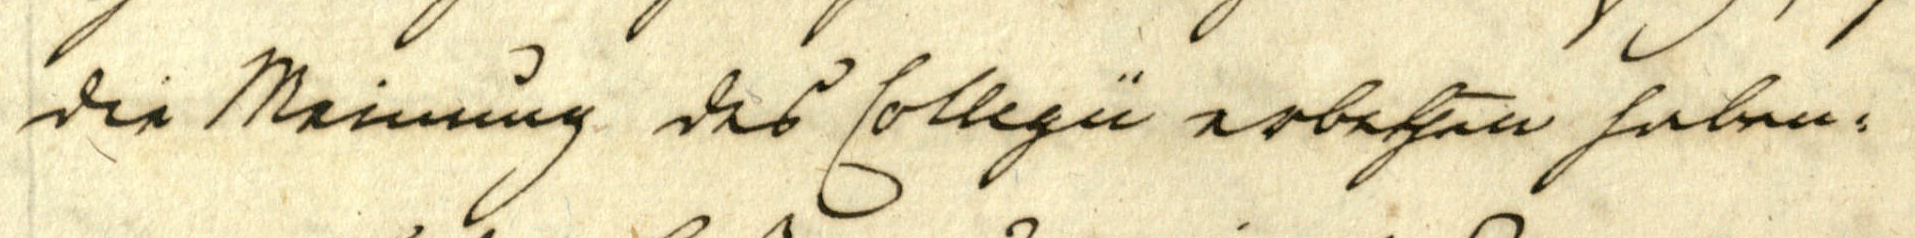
die Meinung des Collegii erbethen haben:
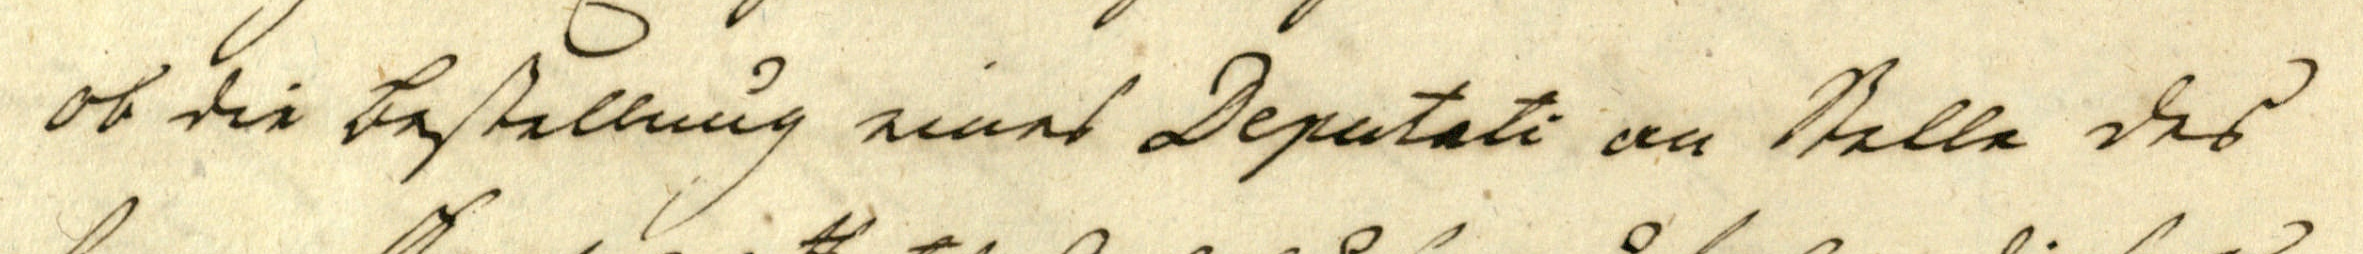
ob die Bestellung eines Deputati an Stelle des
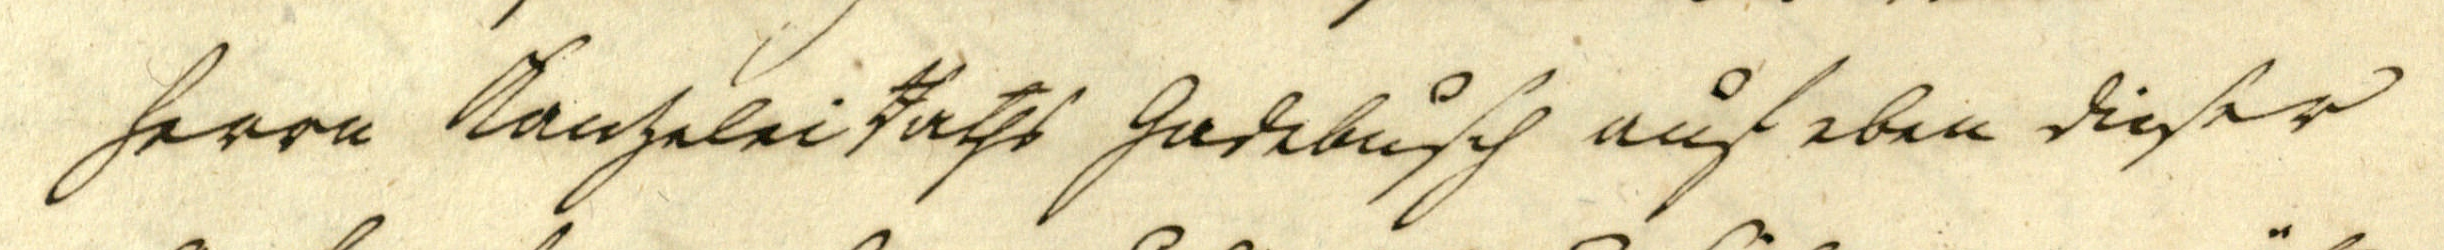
Herrn KanzeleiRaths Gadebusch auf eben dieser
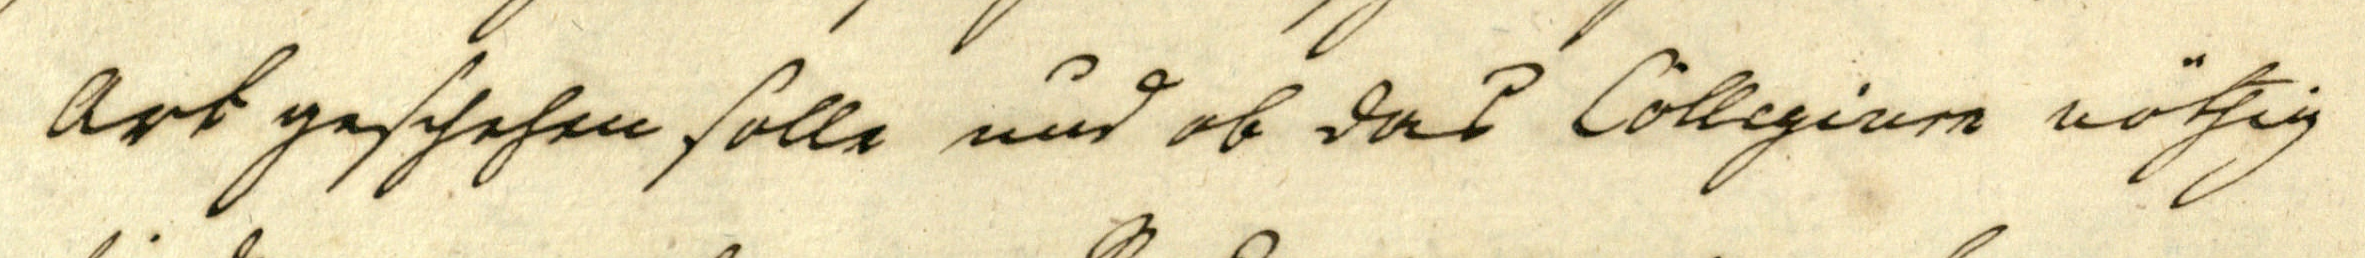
Art geschehen solle und ob das Collegium nöthig
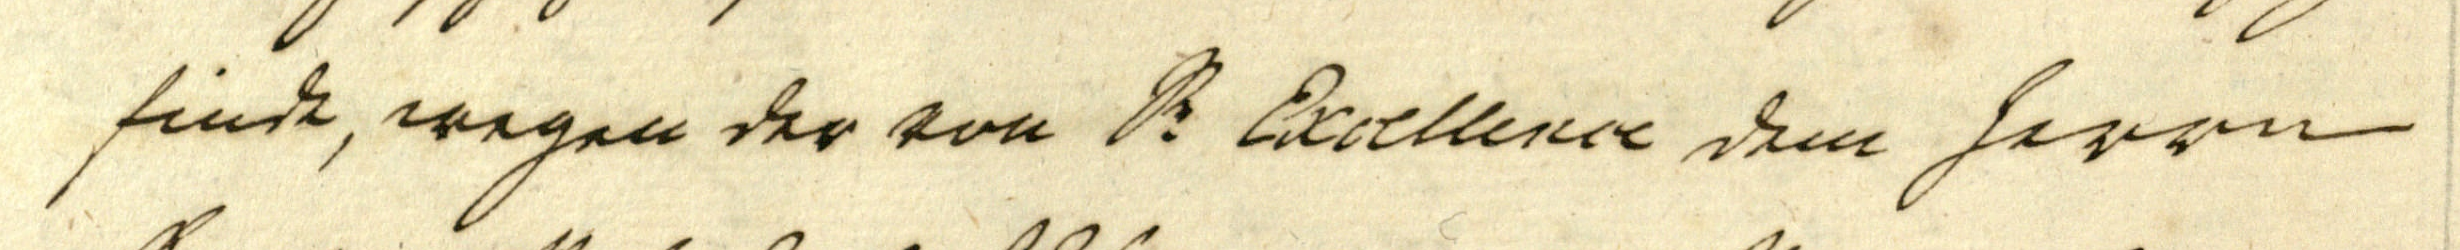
finde, wegen der von Sr Excellence dem Herrn
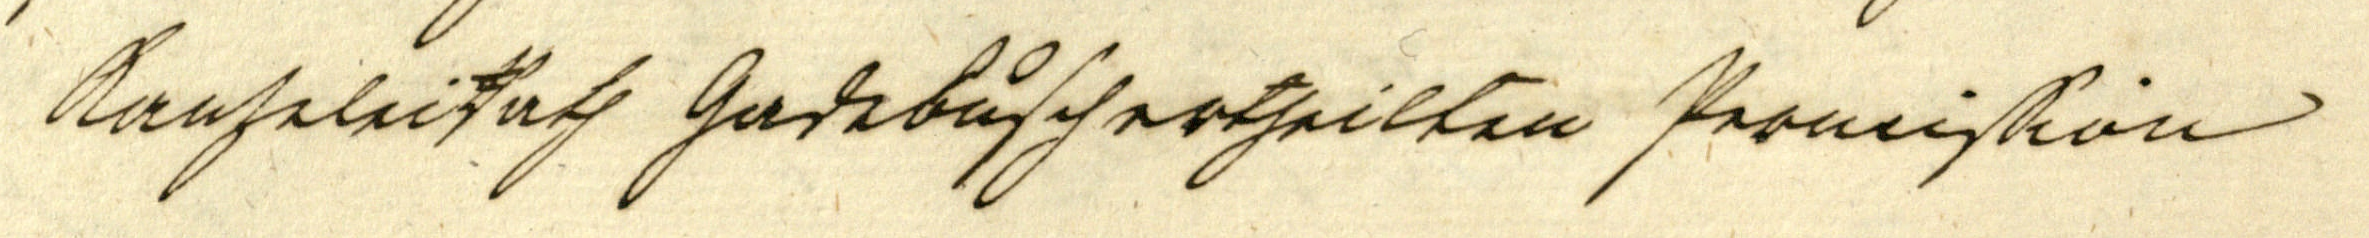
KanzeleiRath Gadebusch ertheilten Permission
